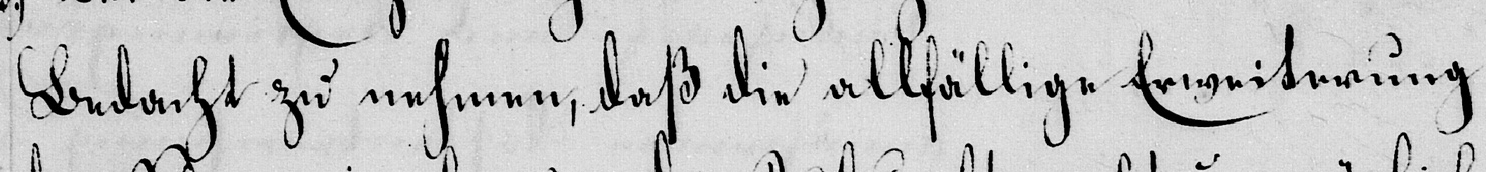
Bedacht zu nehmen, daß die allfällige Erweiterung
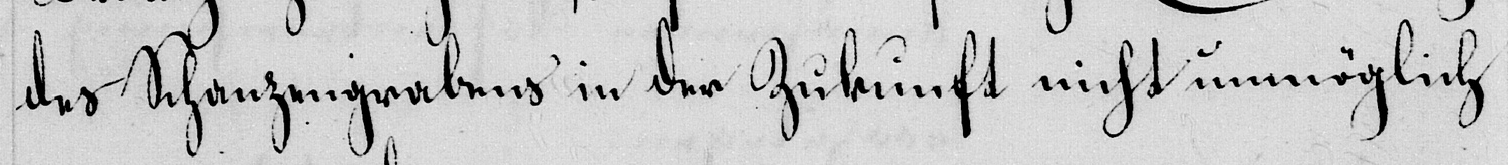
des Schanzengrabens in der Zukunft nicht unmöglich
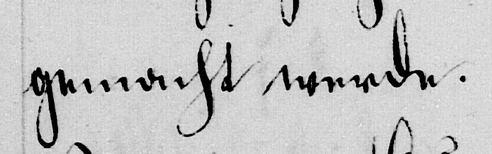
gemacht werde.
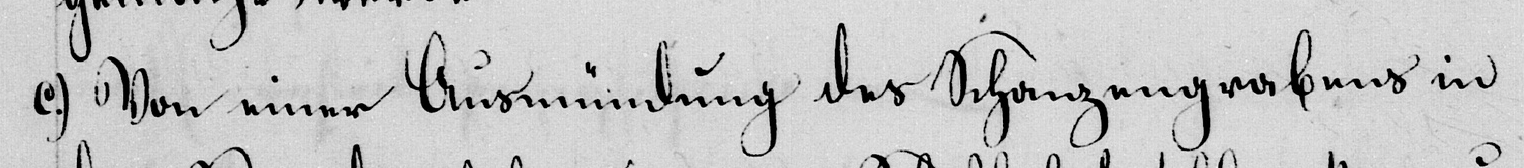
c.) Von einer Ausmündung des Schanzengrabens in
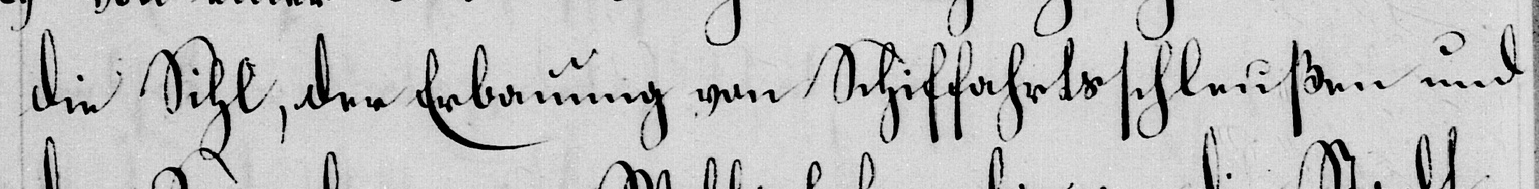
die Sihl, der Erbauung von Schiffahrtsschleußen und
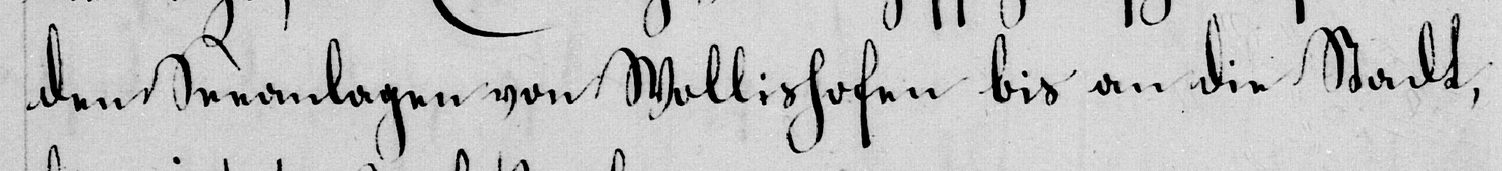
den Seeanlagen von Wollishofen bis an die Stadt
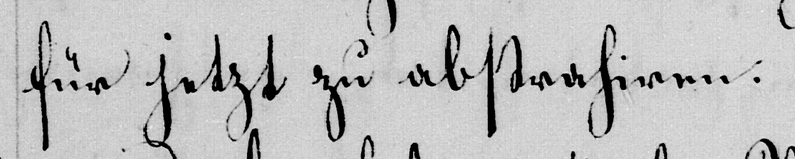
für jetzt zu abstrahiren:
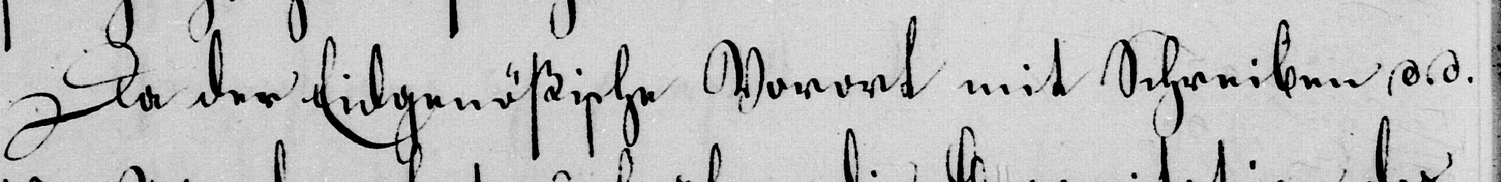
Da der Eidgenößische Vorort mit Schreiben d. d.
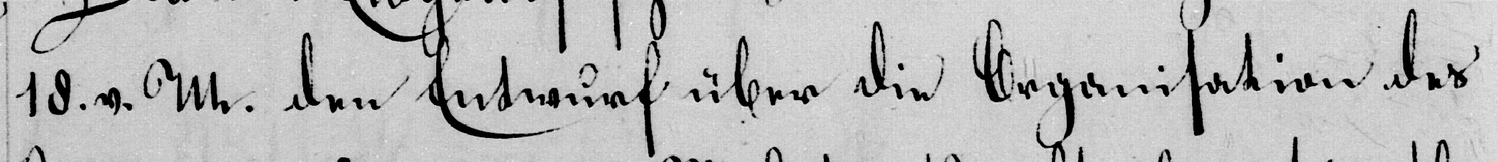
18. v. M. den Entwurf über die Organisation des
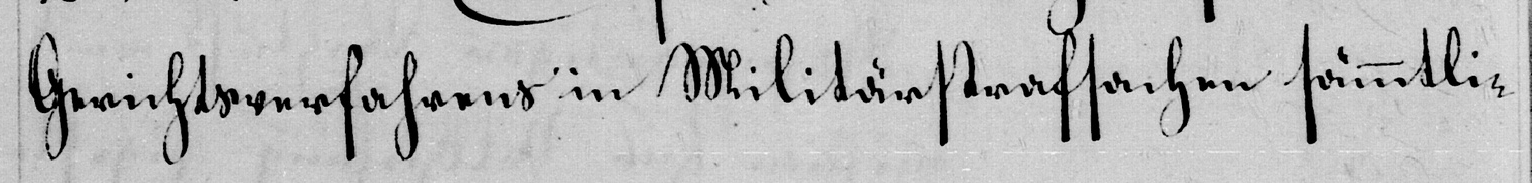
Gerichtsverfahrens in Militärstrafsachen sämmtli-
